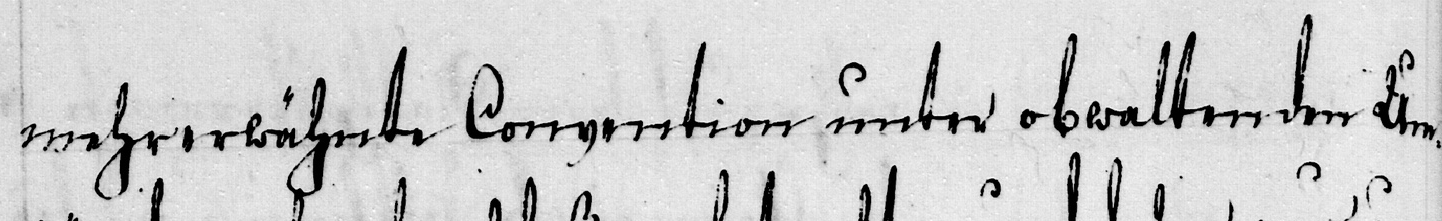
mehrerwähnte Convention unter obwaltenden Um¬
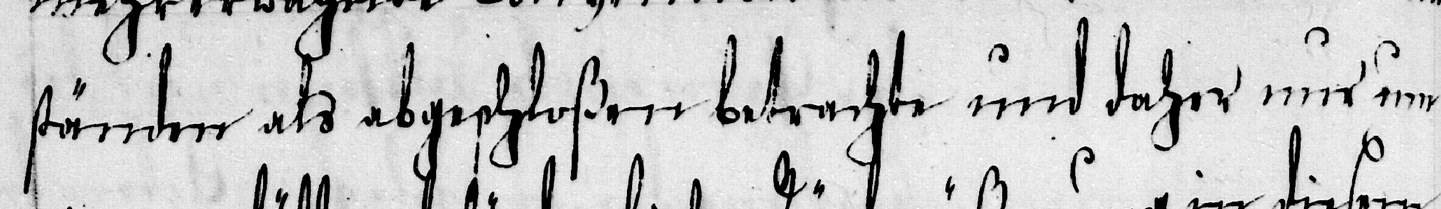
ständen als abgeschloßen betrachte und daher nur um
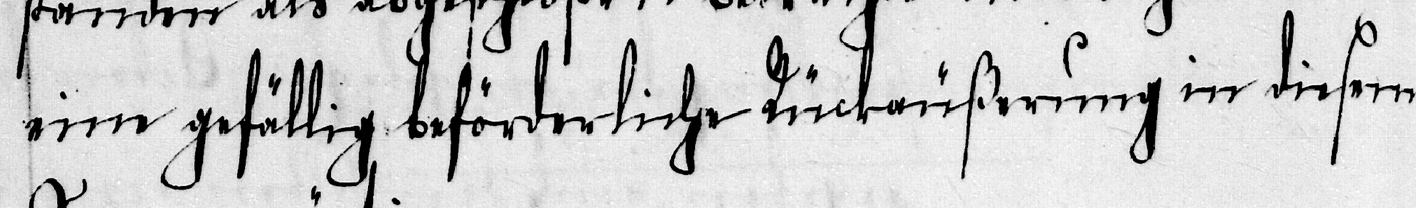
eine gefällig beförderliche Rückäußerung in diesem
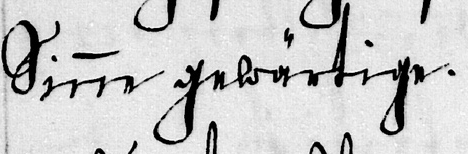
Sinne gewärtige.
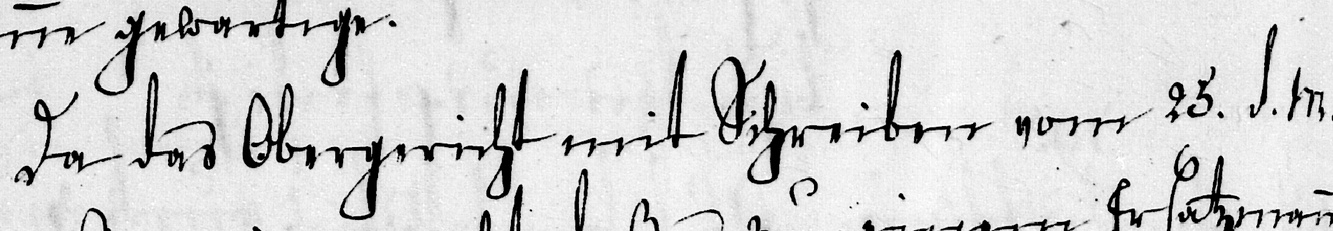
Da das Obergericht mit Schreiben vom 25. d. M.
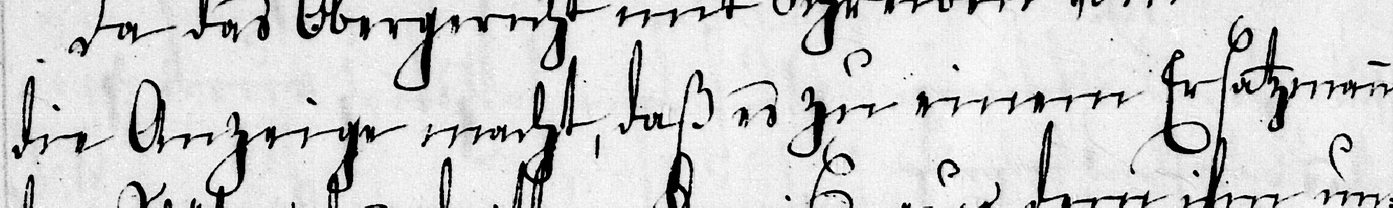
die Anzeige macht, daß es zu einem Ersatzmann
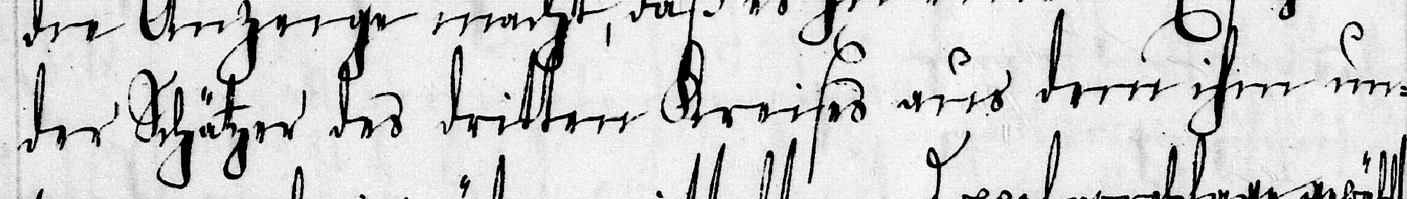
der Schätzer des dritten Kreises aus dem ihm un¬
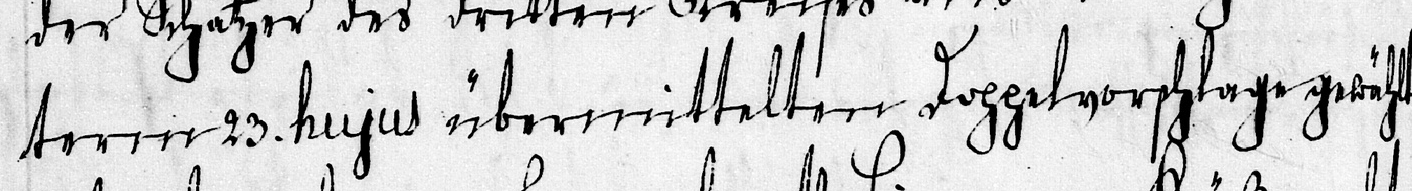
term 23. hujus übermittelten Doppelvorschlage gewäh¬
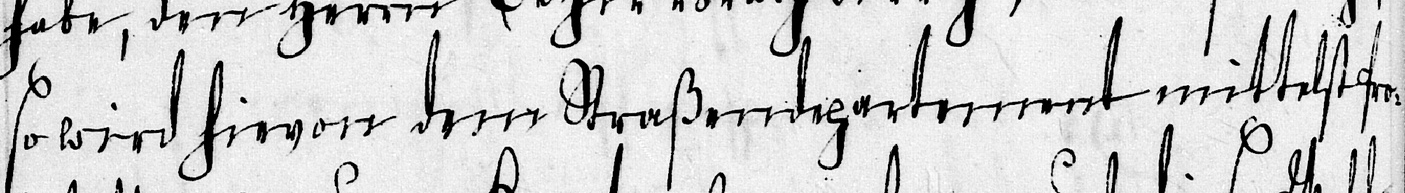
so wird hievon dem Straßendepartement mittelst
